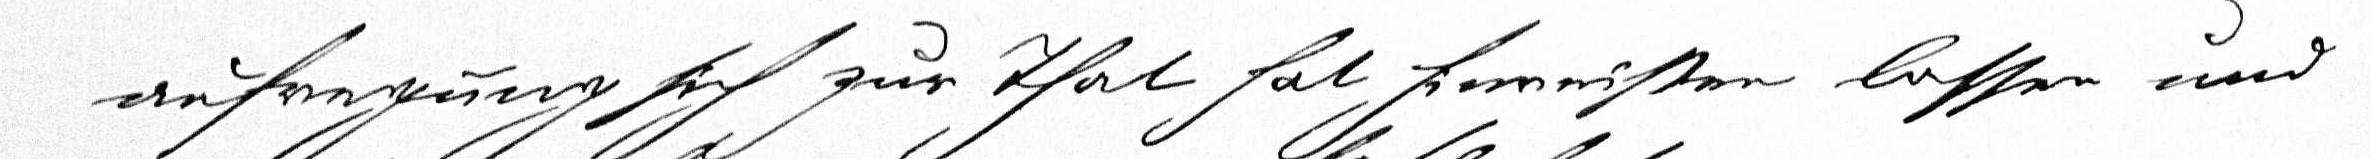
aufregung sich zur That hat hinreißen lassen und
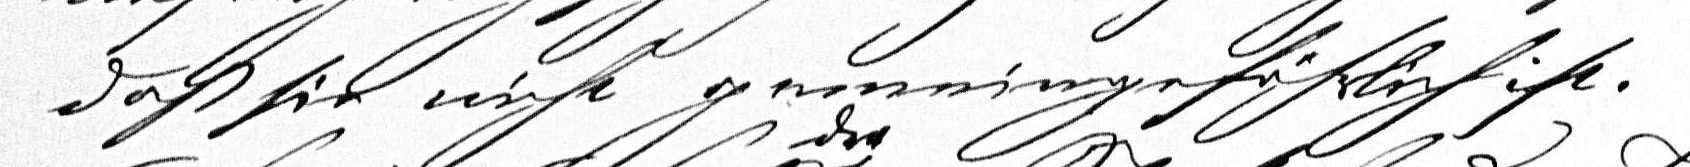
daß sie nicht gemeingefährlich ist.
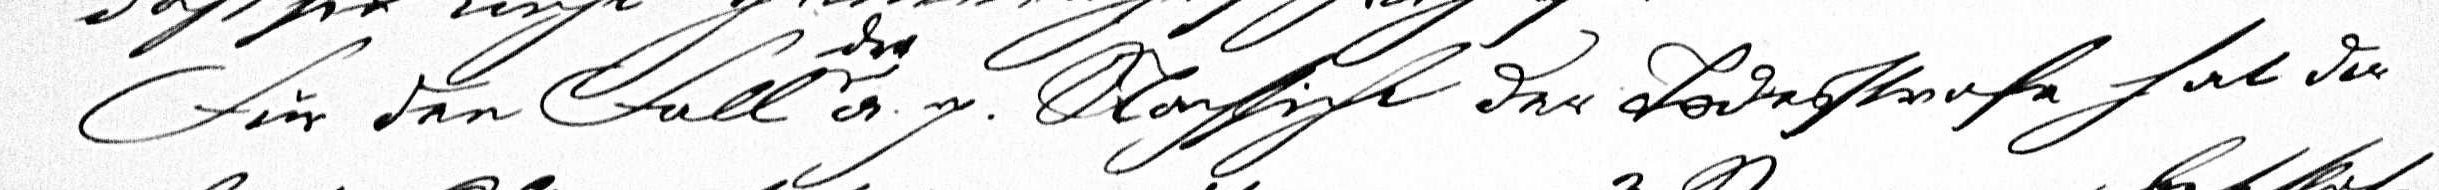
Für den Fall der a.g. Nachsicht der Todesstrafe hat der
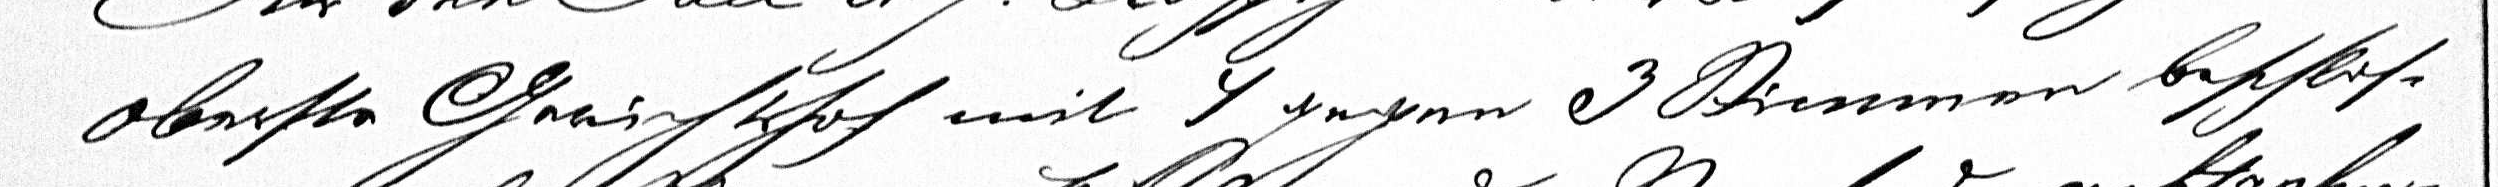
oberste Gerichtshof mit 4 gegen 3 Stimmen beschlos¬
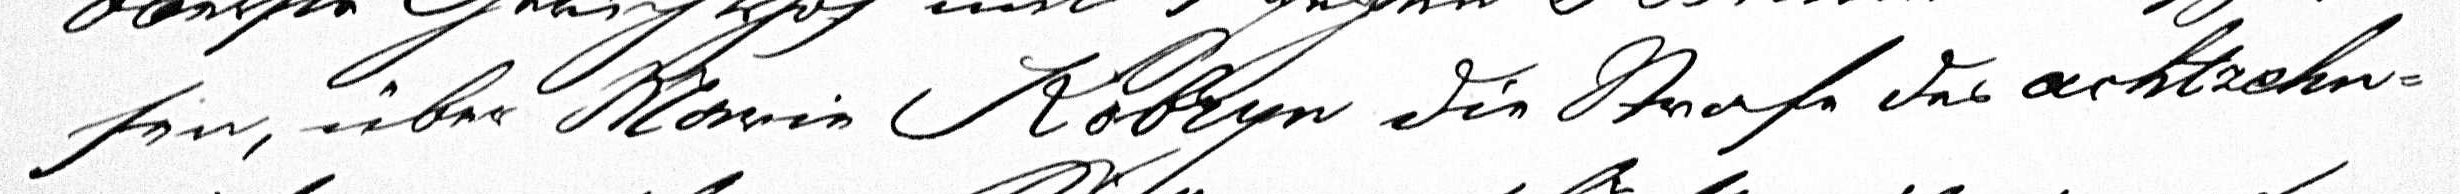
sen, über Marie Kobryn die Strafe des achtzehn¬
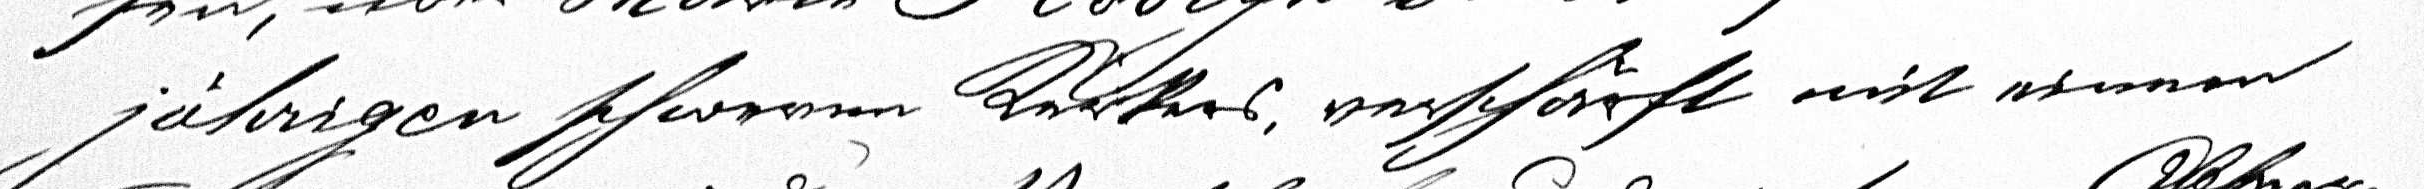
jährigen schweren Kerkers, verschärft mit einem
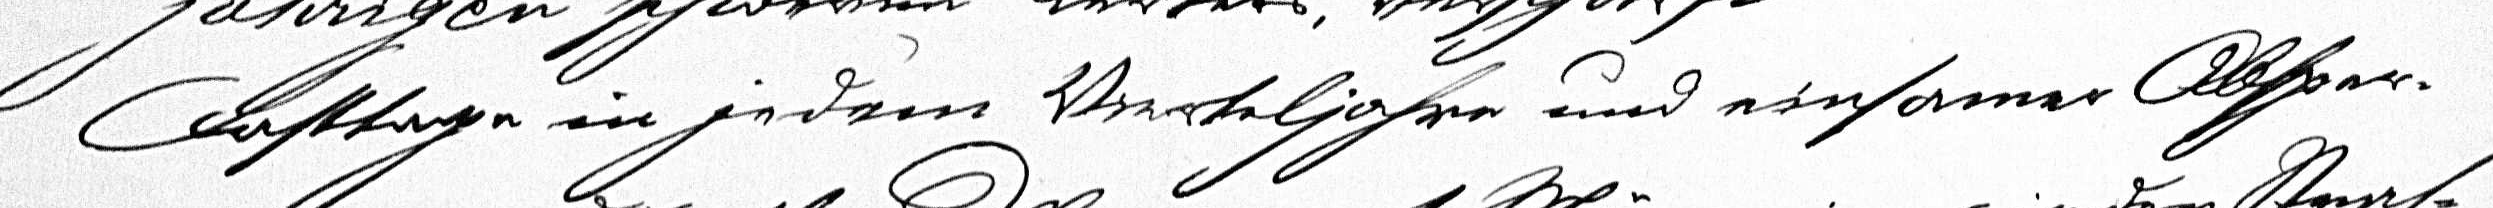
Fasttage in jedem Vierteljahre und einsamer Absper¬
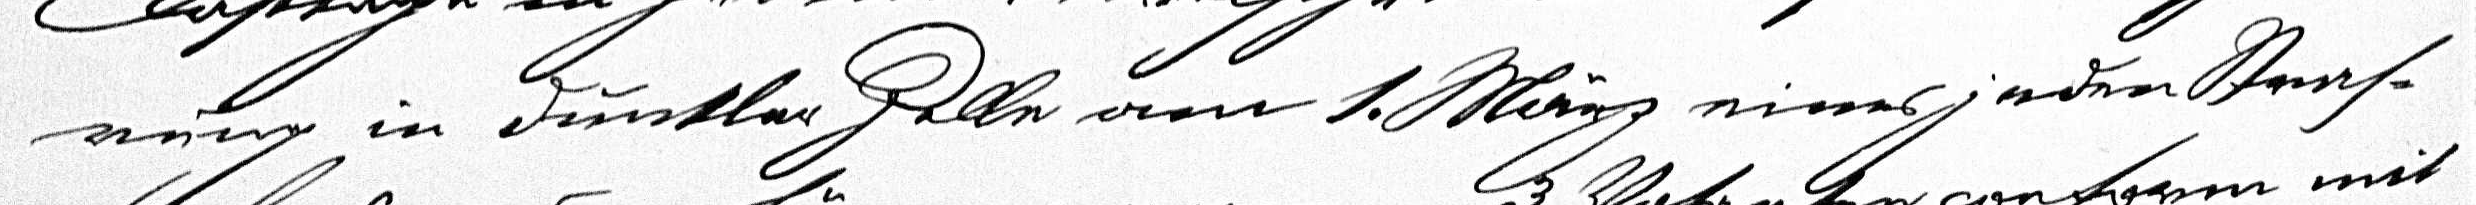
rung in dunkler Zelle am 1. März eines jeden Straf¬
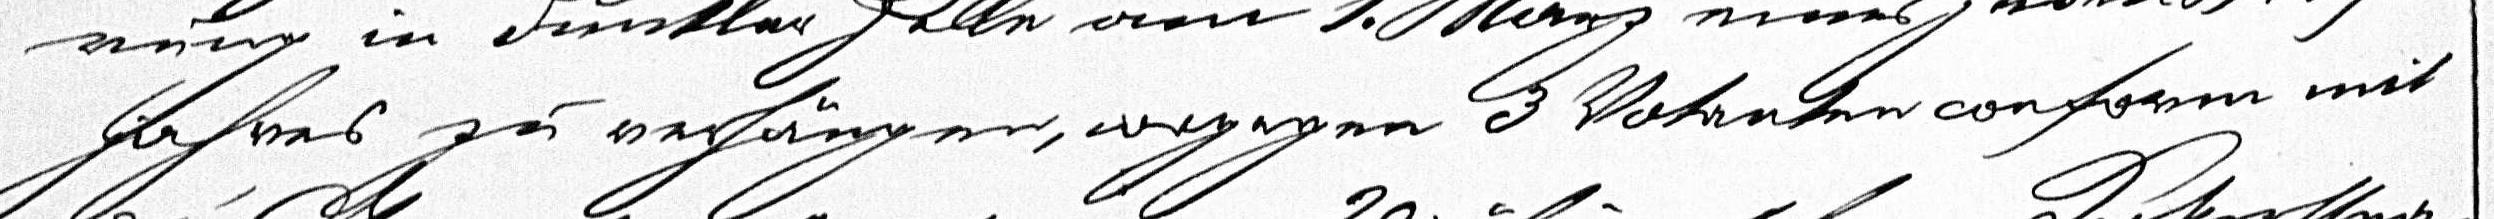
jahres zu verhängen, wogegen 3 Votanten consaren mit
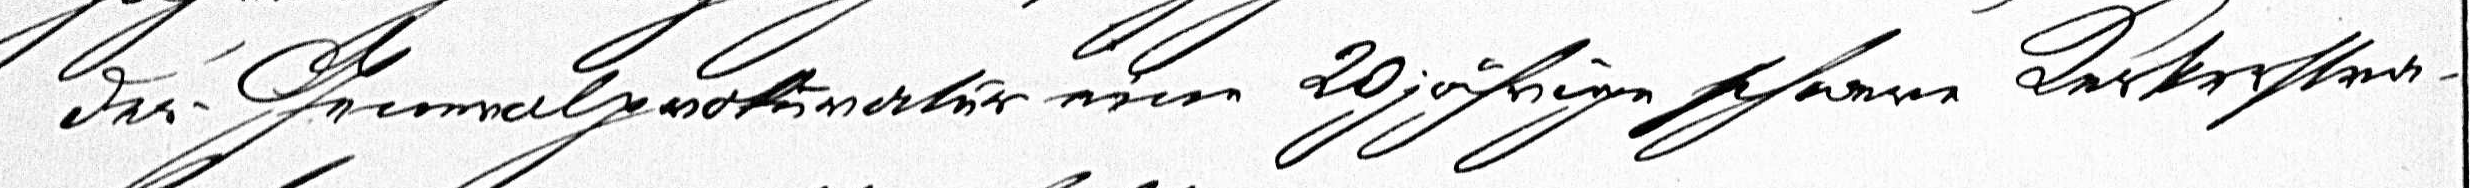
der Generalprokuratur eine 20jährige schwere Kerkerstra¬
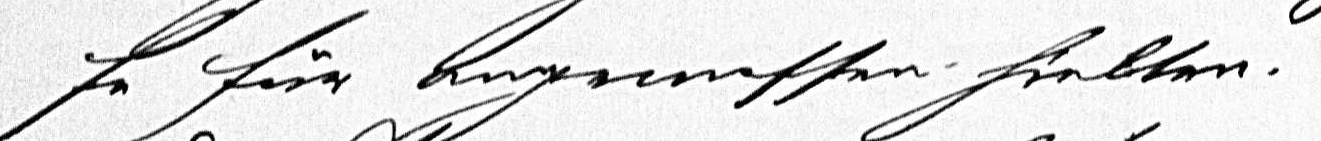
fe für angemessen hielten.
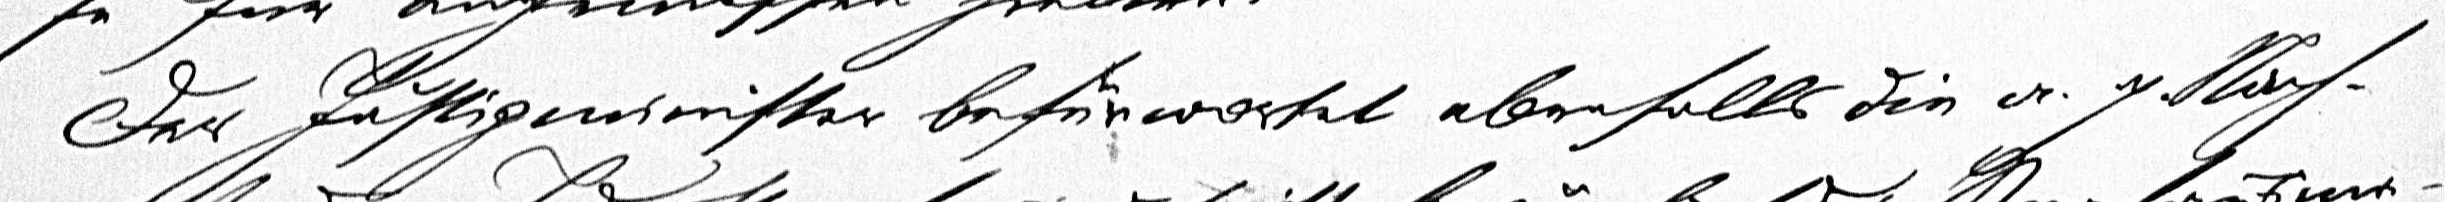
Der Justizminister befürwortet aberfalls die a.g. Nach¬
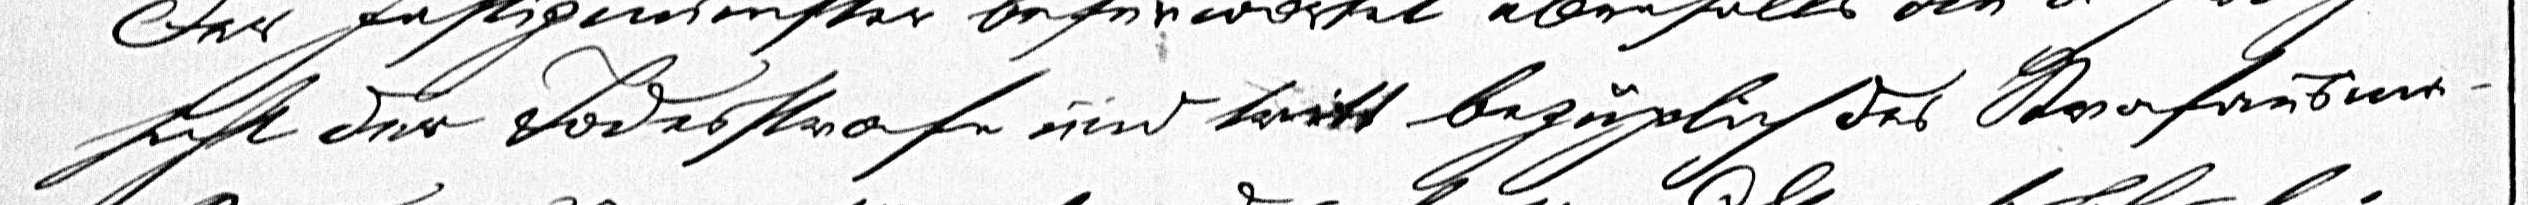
sicht der Todestrafe und tritt bezüglich des Strafausma¬
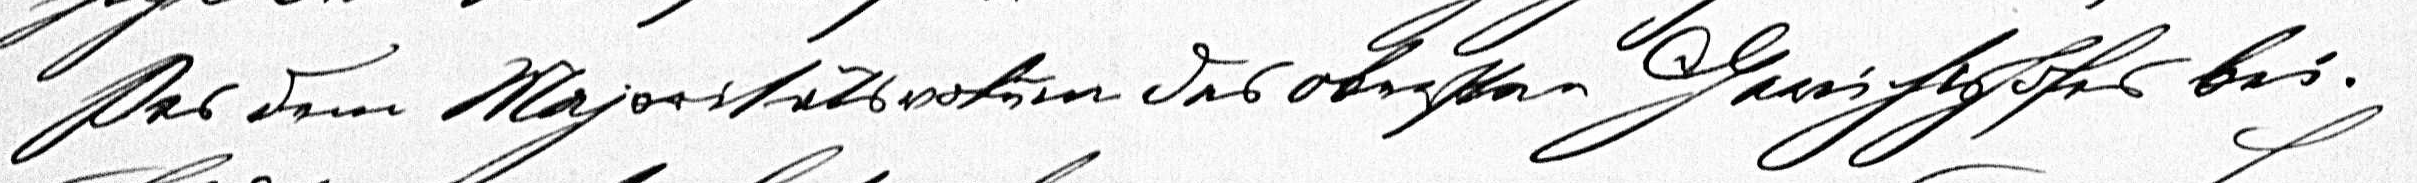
ßes dem Majoritätsvotum des obersten Gerichtshof bei.
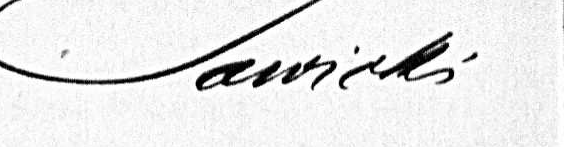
Sawicki
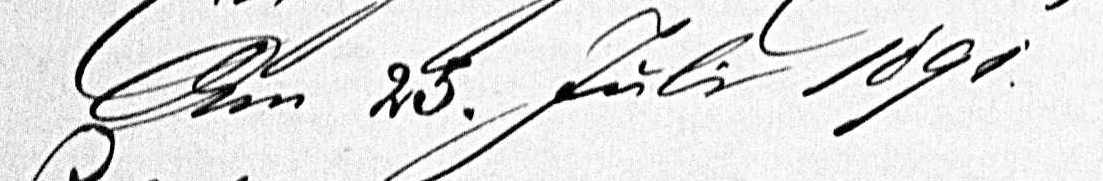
Am 25. Juli 1891
